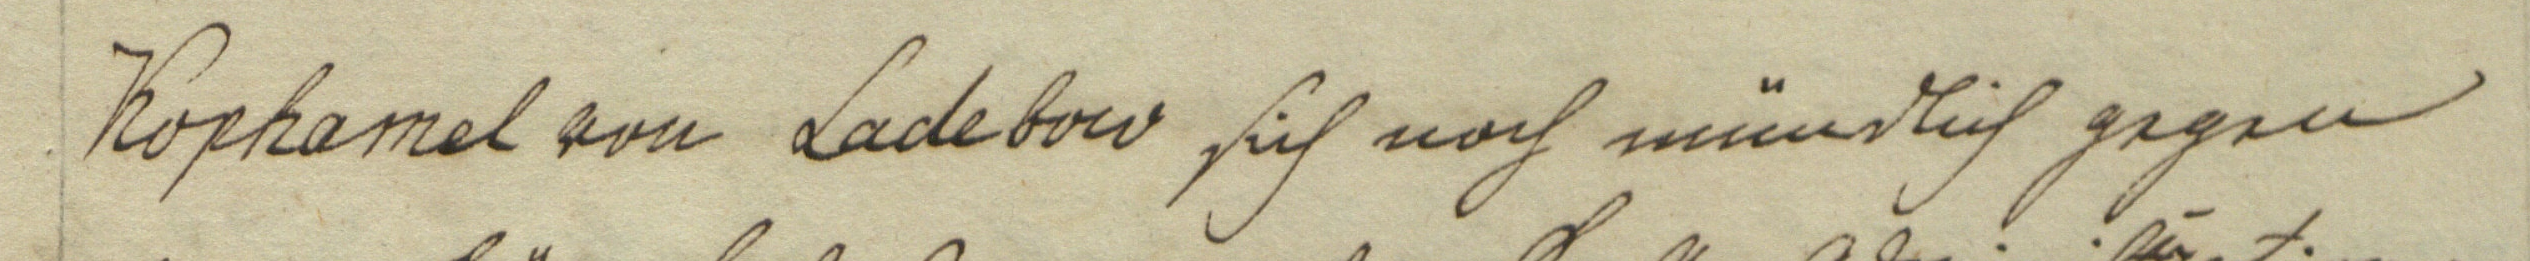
Kophamel von Ladebow sich noch mündlich gegen
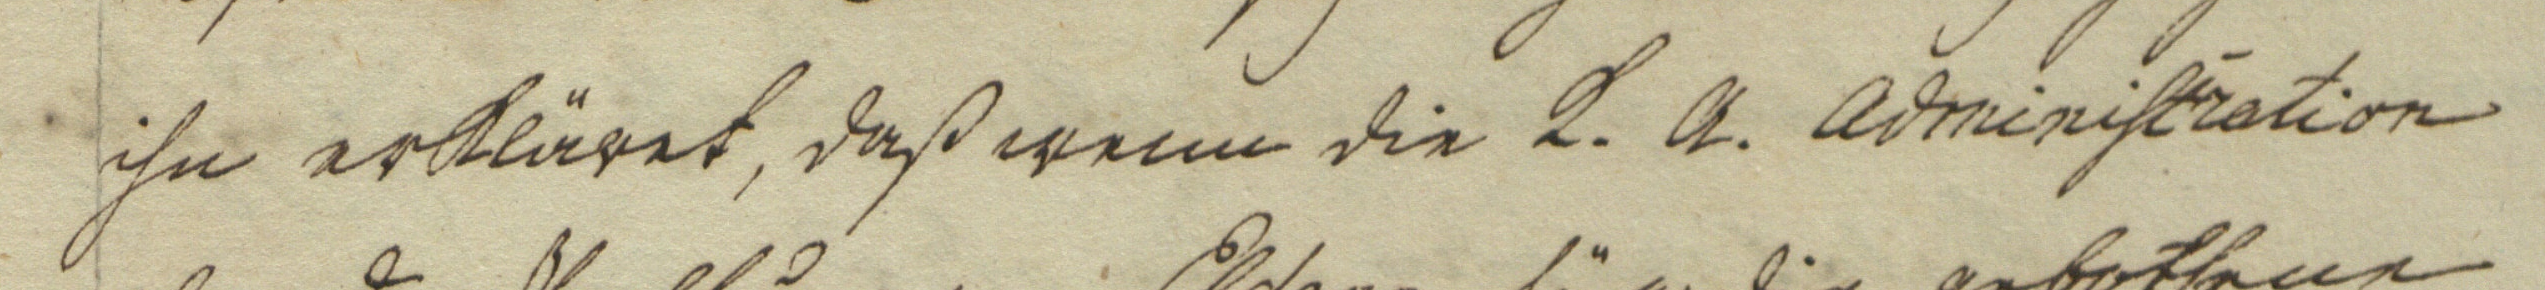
ihn erkläret, daß wenn die K. A. Administration
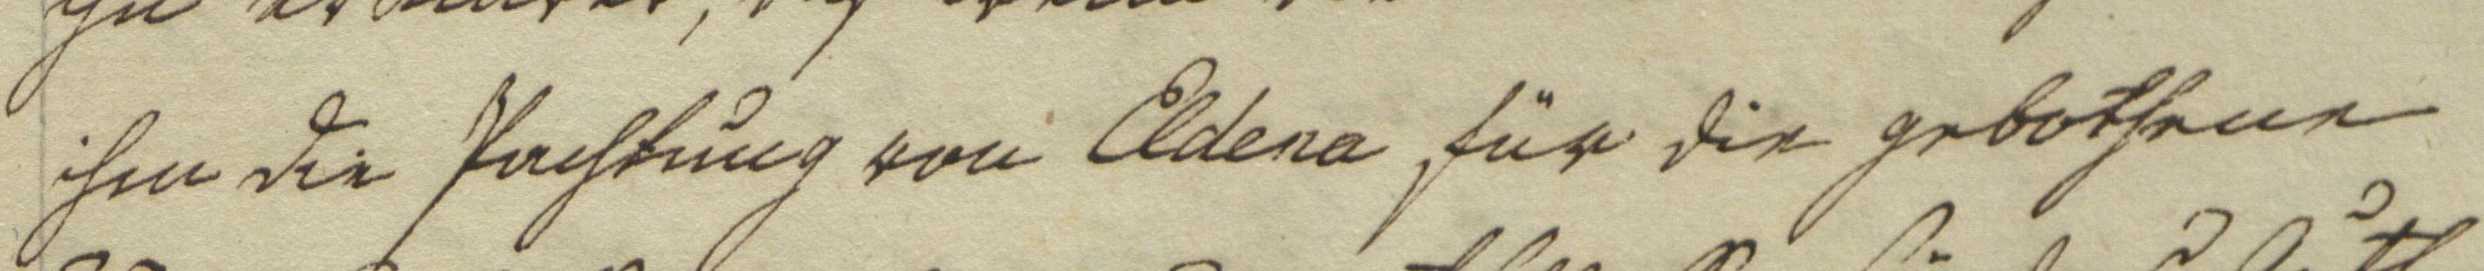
ihm die Pachtung von Eldena für die gebothene
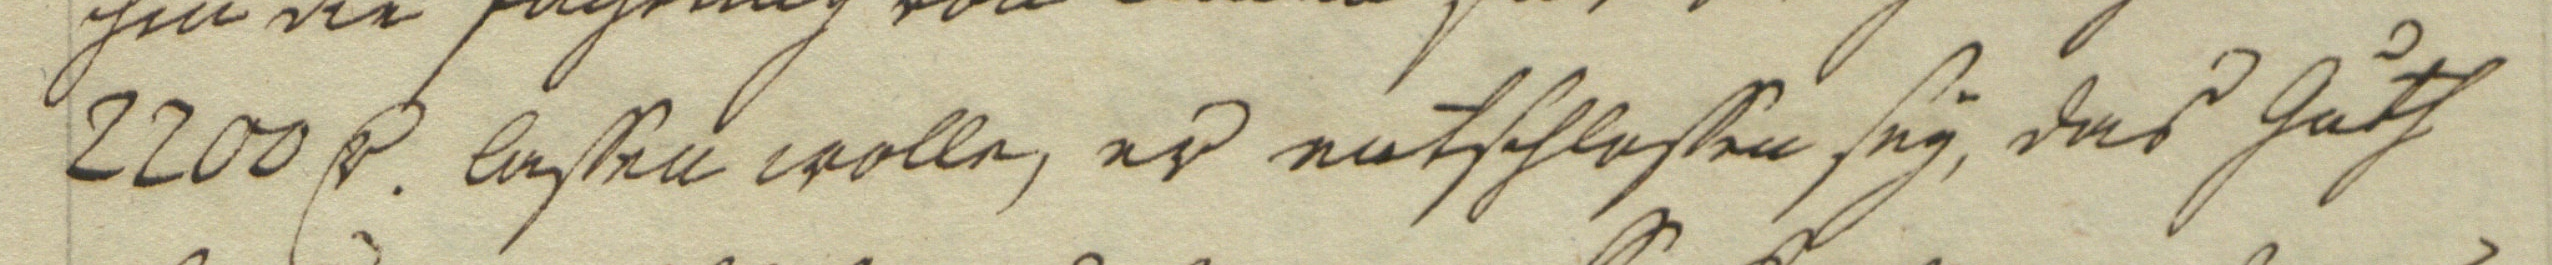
2200 l. lassen wolle, er entschlossen seÿ, das Guth
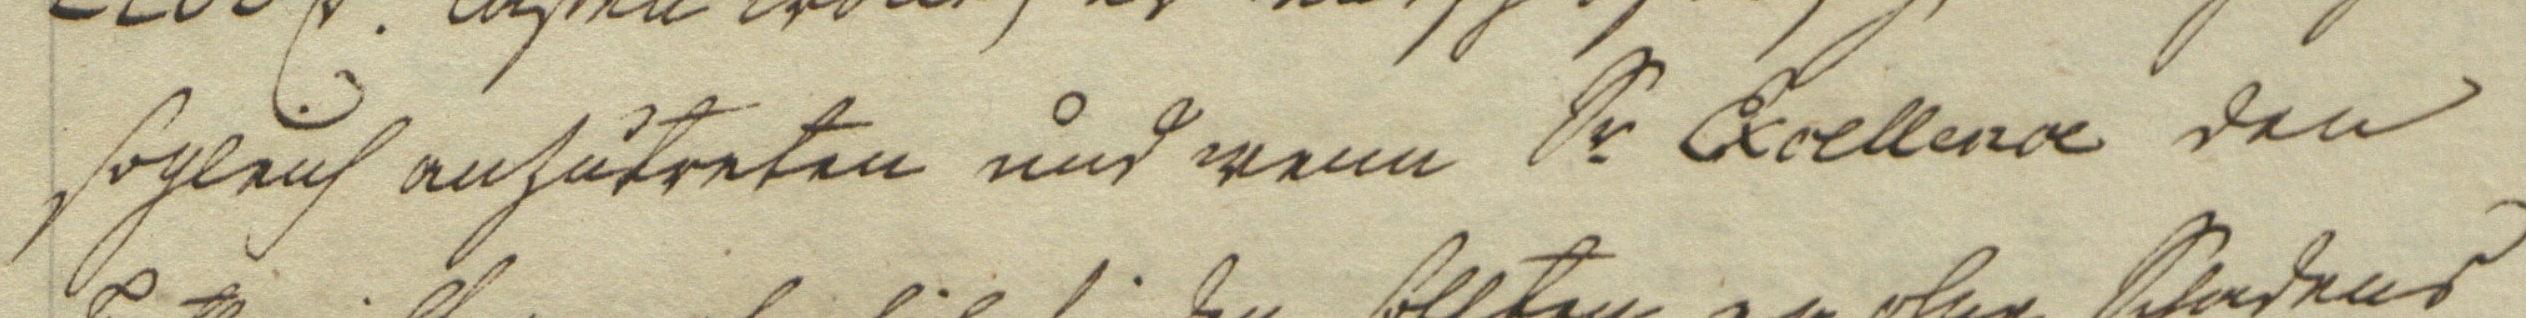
sogleich anzutreten und wenn Sr Excellence den
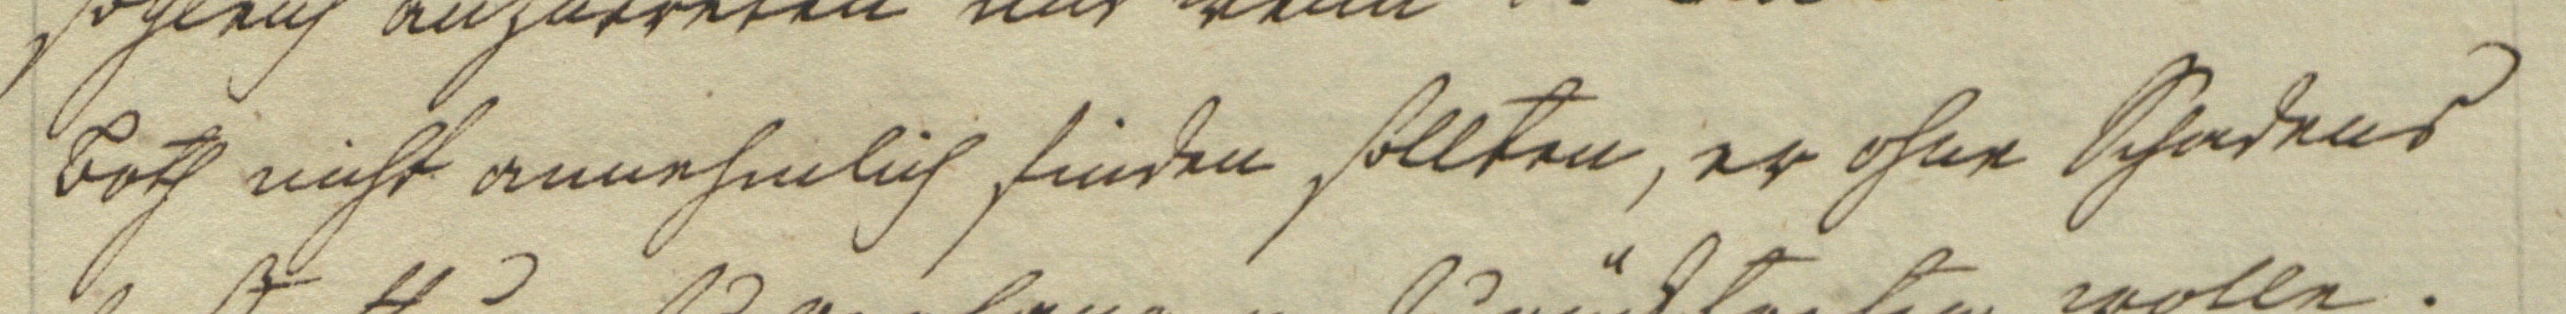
Both nicht anehmlich finden sollten, er ohne Schadens
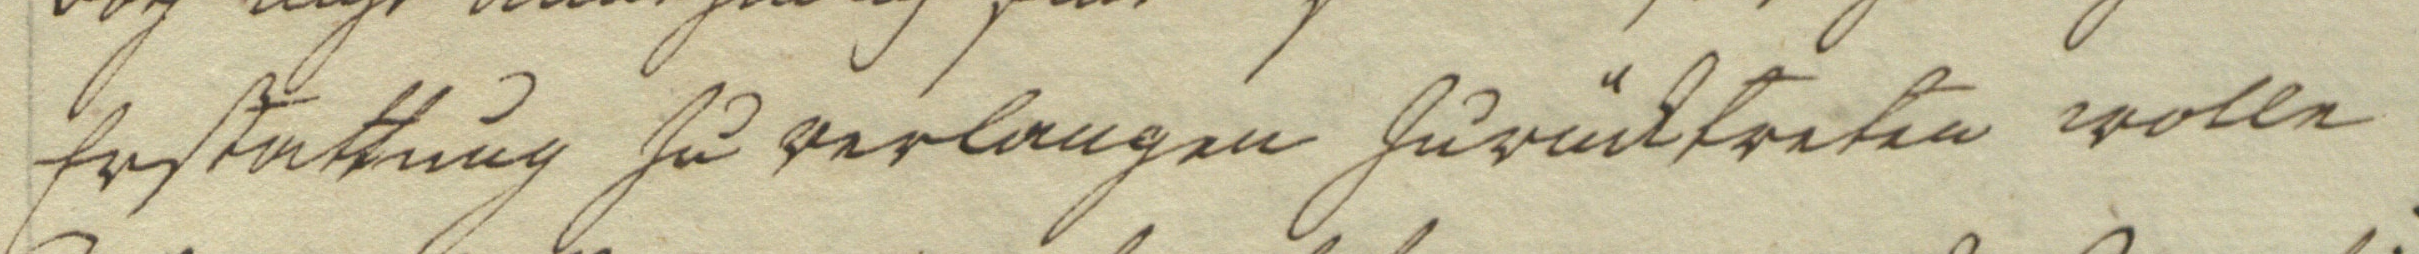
Erstattung zu verlangen zurücktreten wolle.
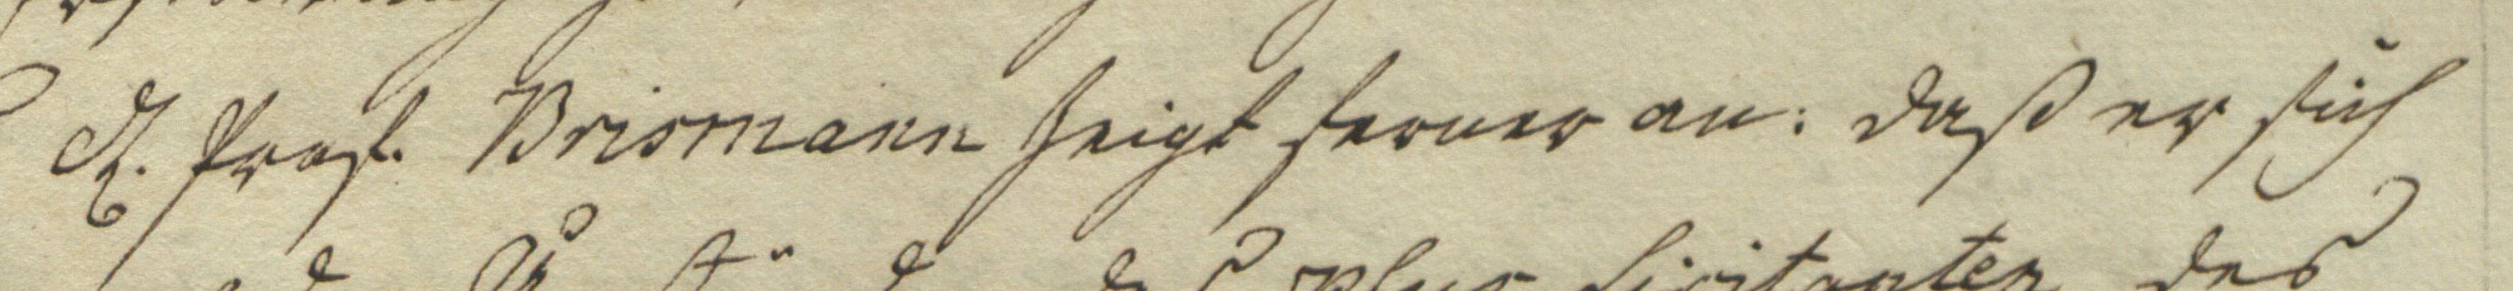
dh. Prof. Brismann zeigt ferner an: daß er sich
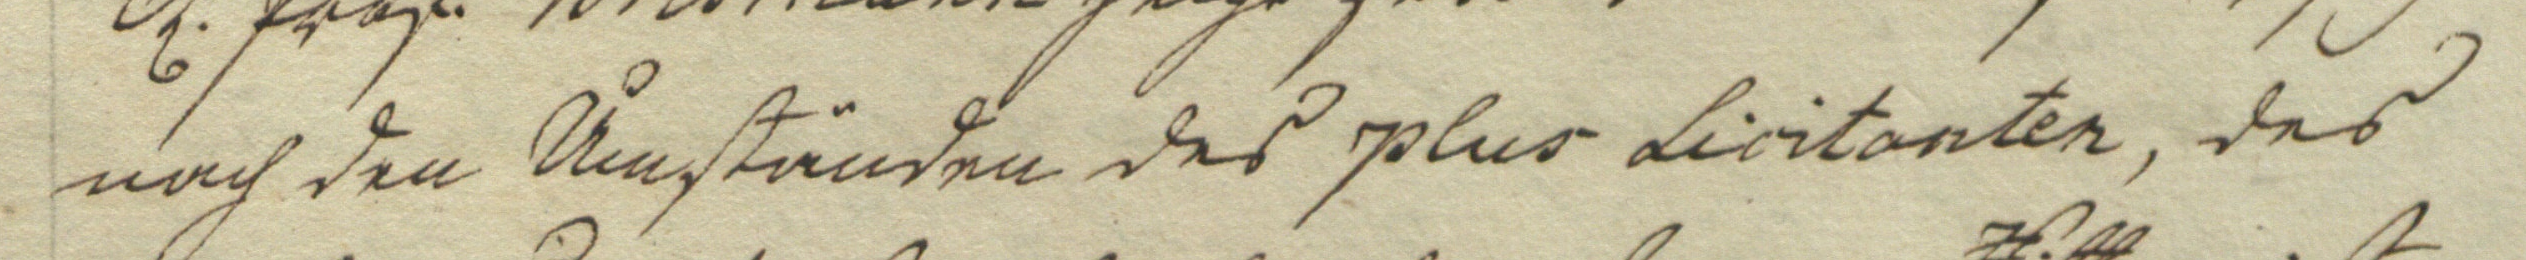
nach den Umständen des plus Licitanten, des
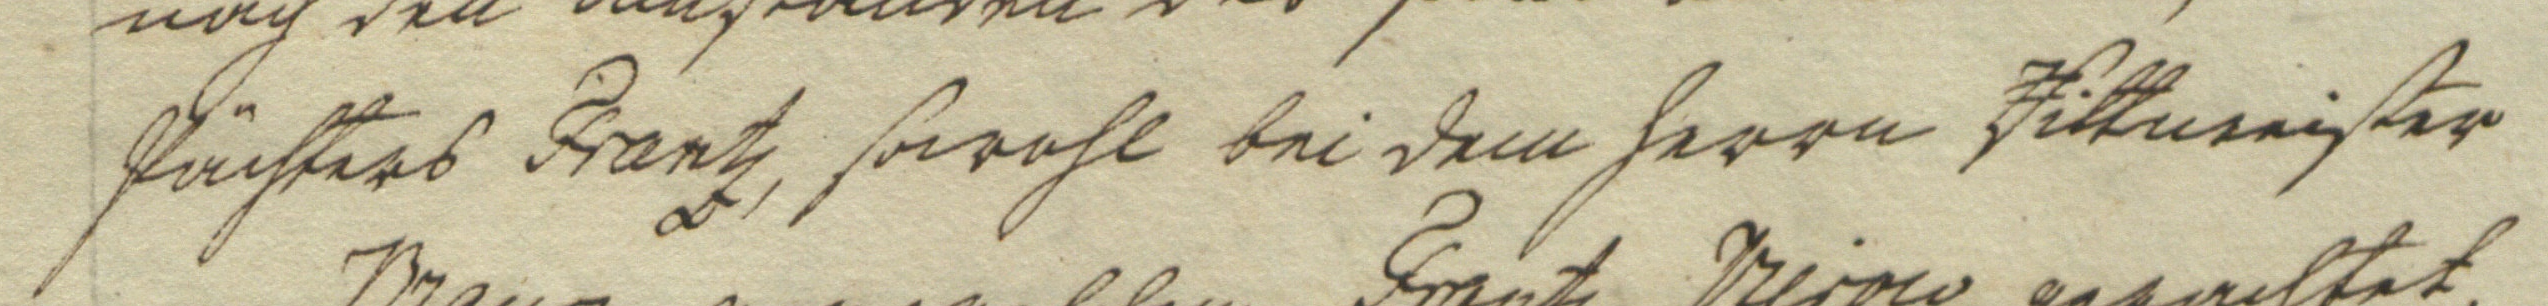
Pächters Frantz, sowohl bei dem Herrn Rittmeister
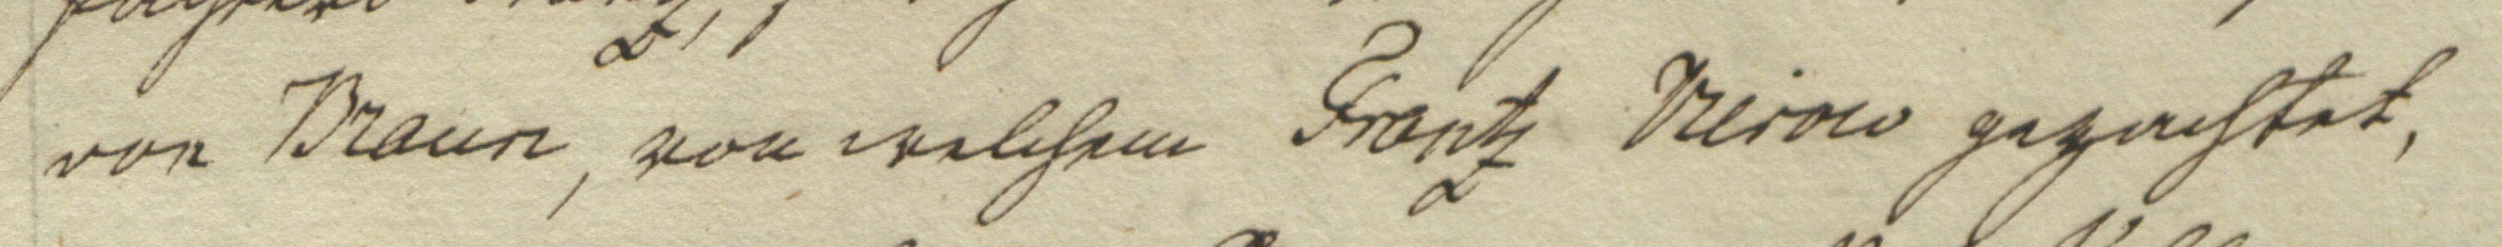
von Braun, von welchem Frantz Vierow gepachtet,
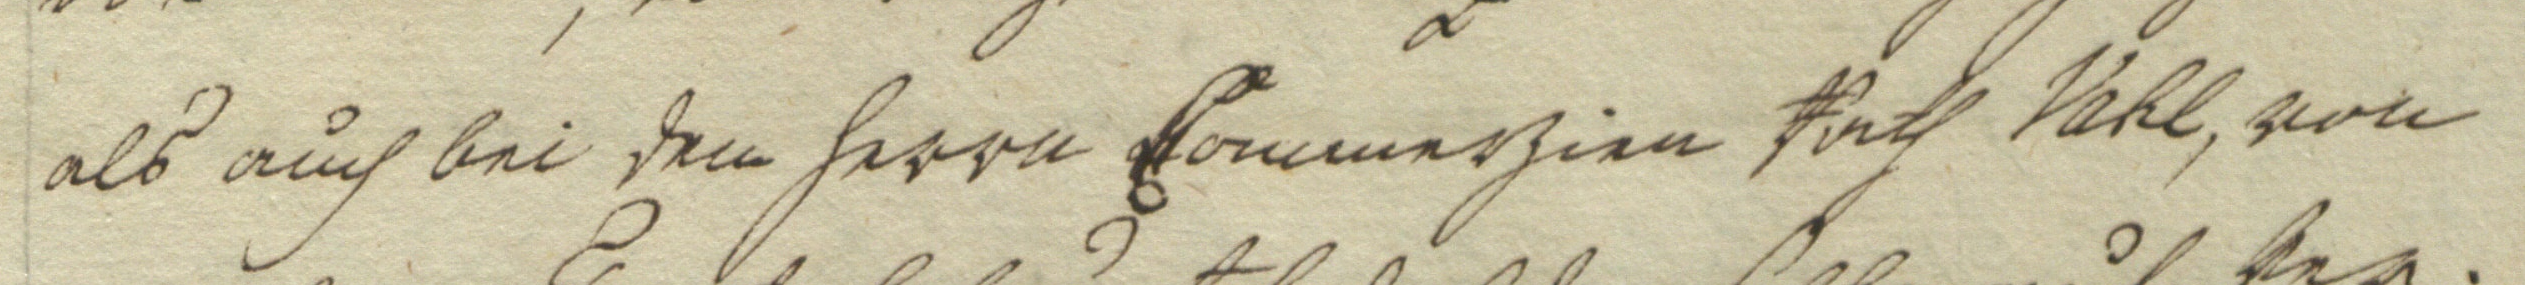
als auch bei dem Herrn Commerzien Rath Vahl, von
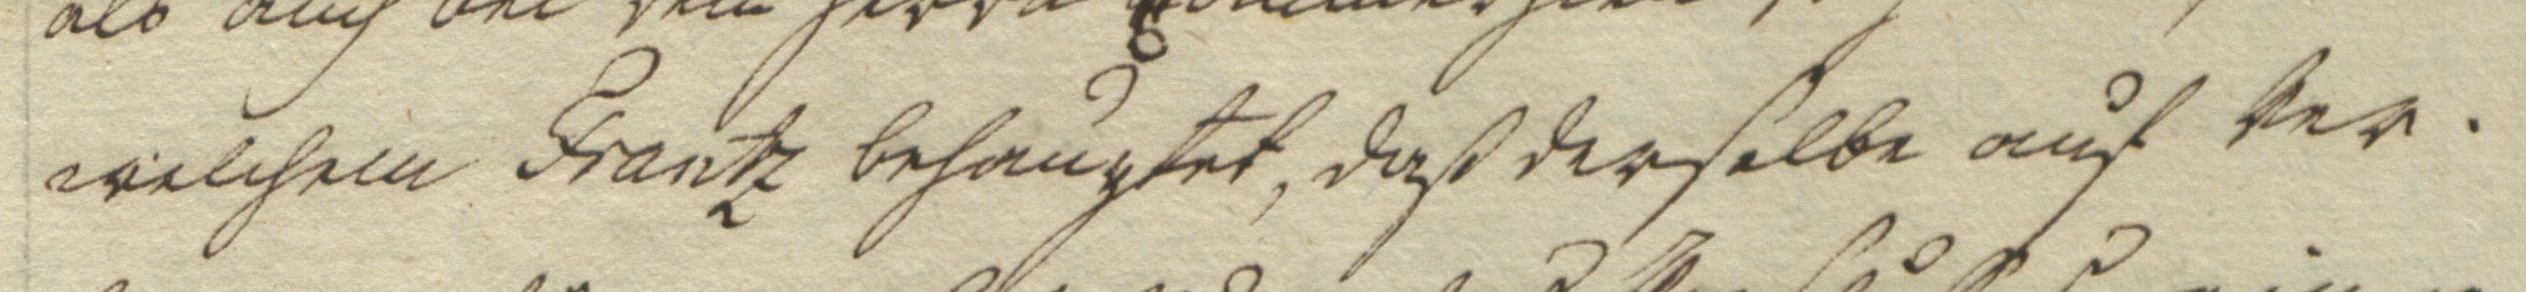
welchem Frantz behauptet, daß derselbe auf Ver¬
